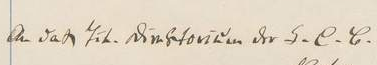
An das Tit. Direktorium der S.C.B.
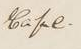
Basel.
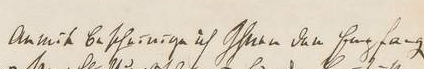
Anmit bescheinige ich Ihnen den Empfang
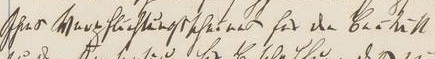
Ihres Verpflichtungsscheines für den Beitritt
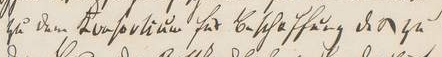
zu dem Konsortium für Beschaffung des zu
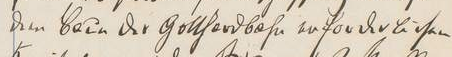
dem Baue der Gotthardbahn erforderlichen
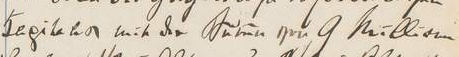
Kapitales mit der Summe von 9 Millionen
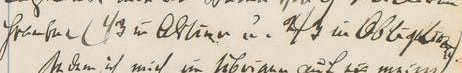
Franken (⅓ in Aktien u. ⅔ in Obligationen).
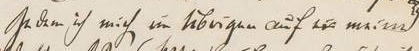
Indem ich mich im Übrigen auf ei meine
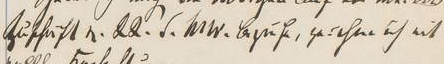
Zuschrift v. 22. d. Mts. beziehe, zeichne ich mit
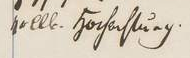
vollk. Hochachtung.
